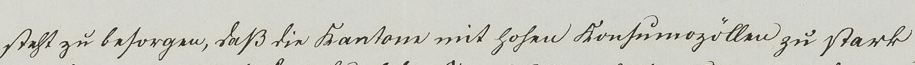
steht zu besorgen, daß die Kantone mit hohen Konsumozöllen zu stark
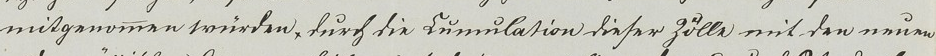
mitgenommen würden durch die Cumulation dieser Zölle mit den neuen
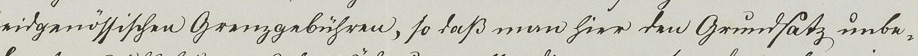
eidgenössischen Grenzgebühren, so daß man hier den Grundsatz unbe-
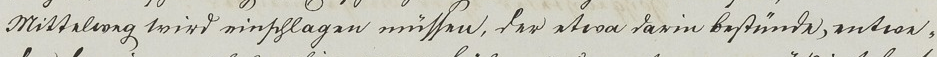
Mittelweg wird einschlagen müssen, der etwa darin bestünde, entwe-
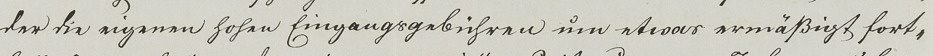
der die eigenen hohen Eingangsgebühren um etwas ermäßigt fort-
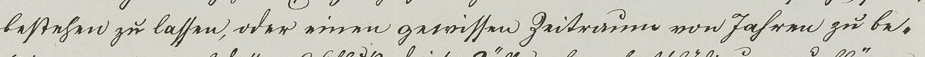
bestehen zu lassen, oder einen gewissen Zeitraum von Jahren zu be-
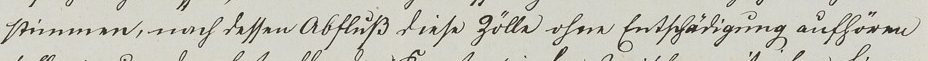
stimmen, nach dessen Abfluß diese Zölle ohne Entschädigung aufhören
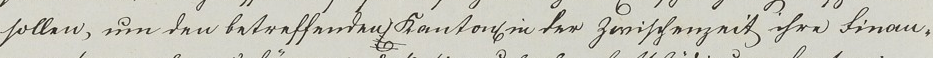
sollen, um den betreffenden Kantonen in der Zwischenzeit ihre Finan-
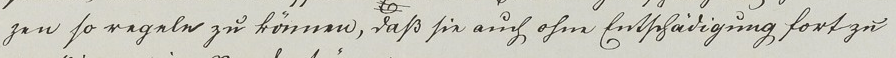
zen so regeln zu können, daß sie auch ohne Entschädigung fort zu
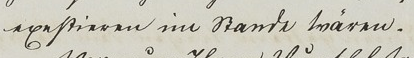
exestieren im Stande wären.
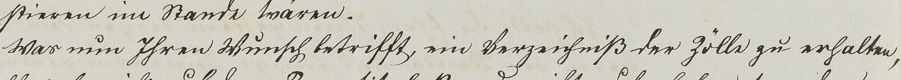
Was nun Ihren Wunsch betrifft, ein Verzeichniß der Zölle zu erhalten,
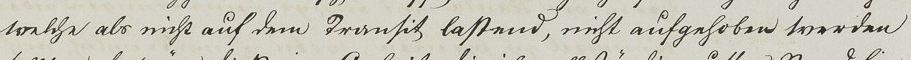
welche als nicht auf dem Transit lastend, nicht aufgehoben werden
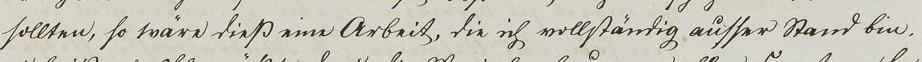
sollten, so wäre dieß eine Arbeit, die ich vollständig ausser Stand bin
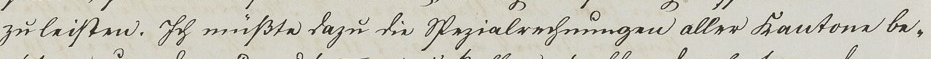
zu leisten. Ich müßte dazu die Spezialrechnungen aller Kantone be-
